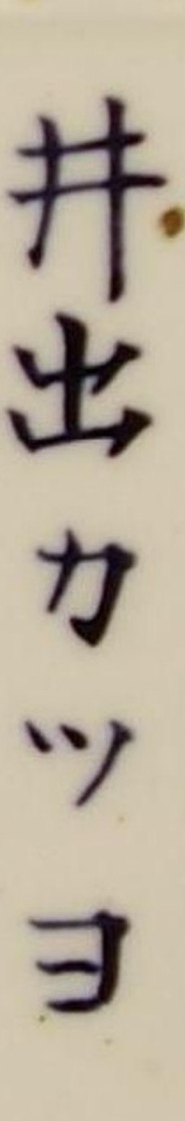井出カツヨ
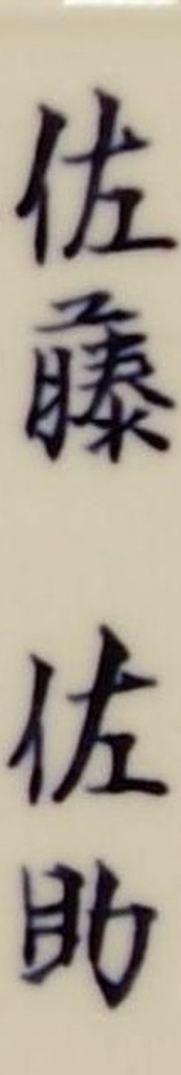佐藤佐助
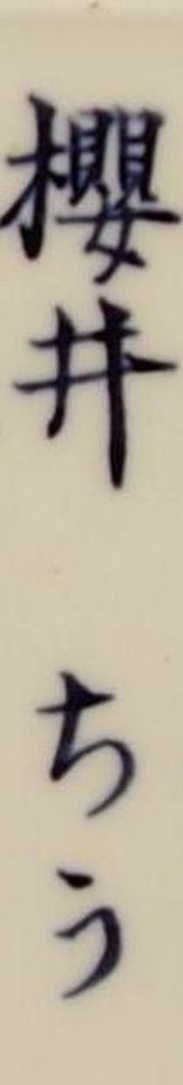桜井ちう
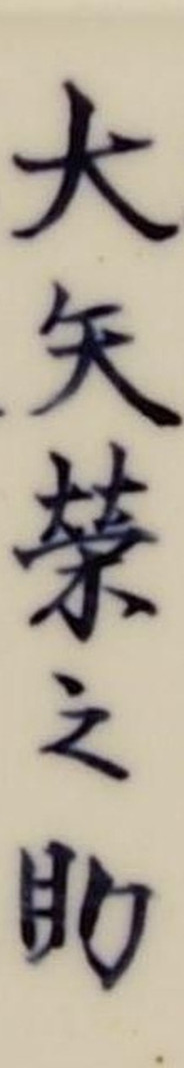大矢榮之助
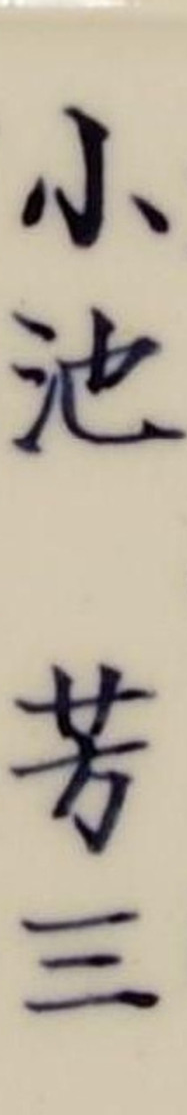小池芳三
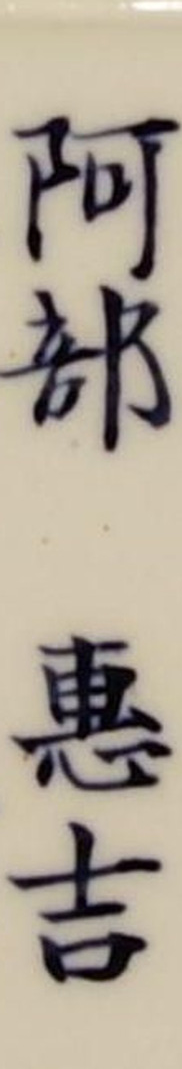阿部恵吉
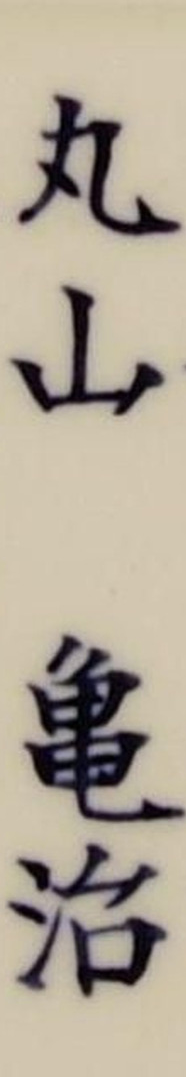丸山亀治
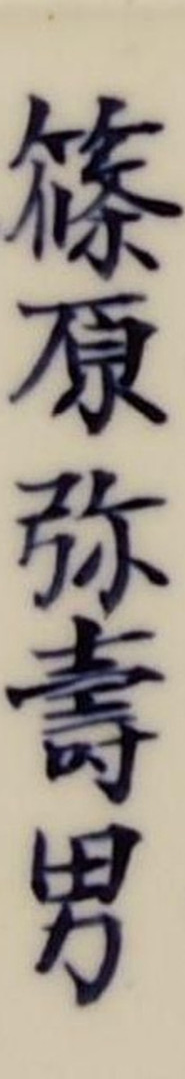篠原弥寿男
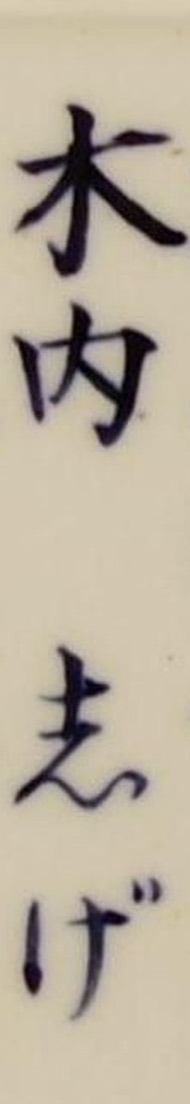木内しげ
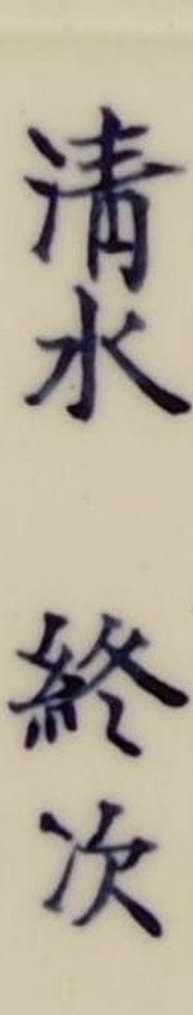清水終次
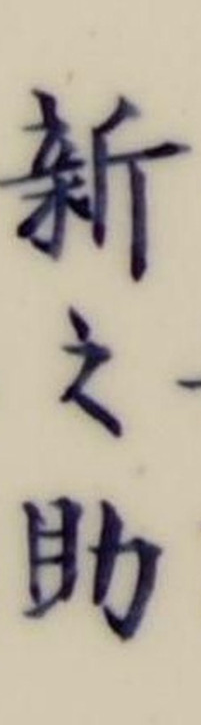新之助
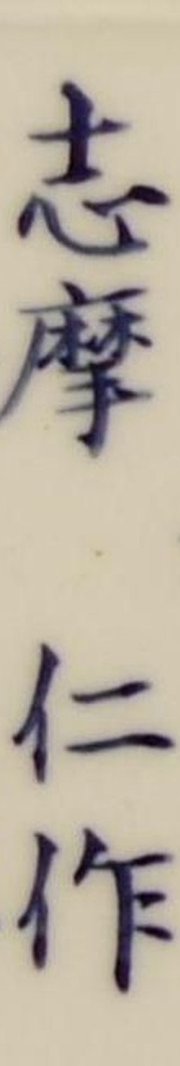志摩仁作
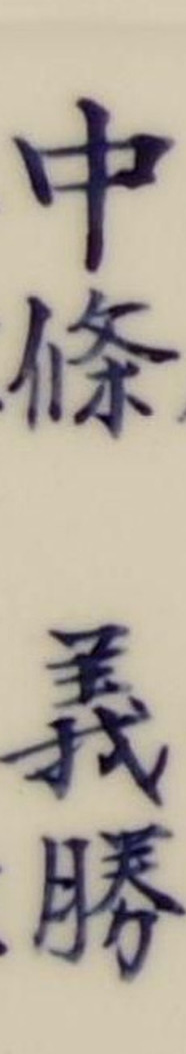中條義勝
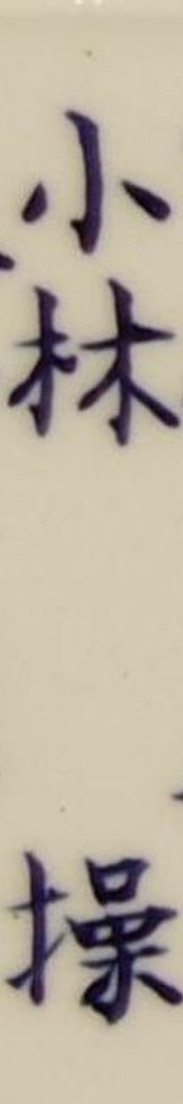小林操
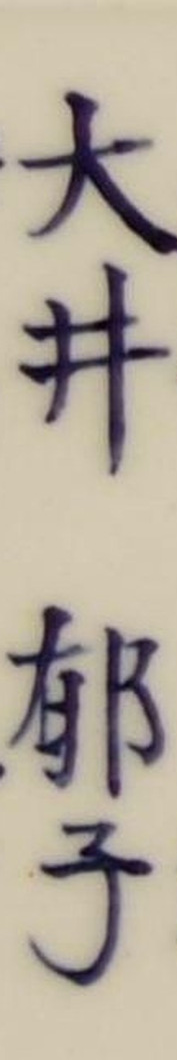大井郁子
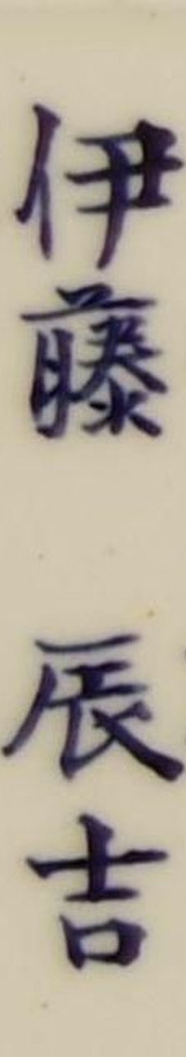伊藤辰吉
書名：A~D
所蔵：koyasan kongobuji
